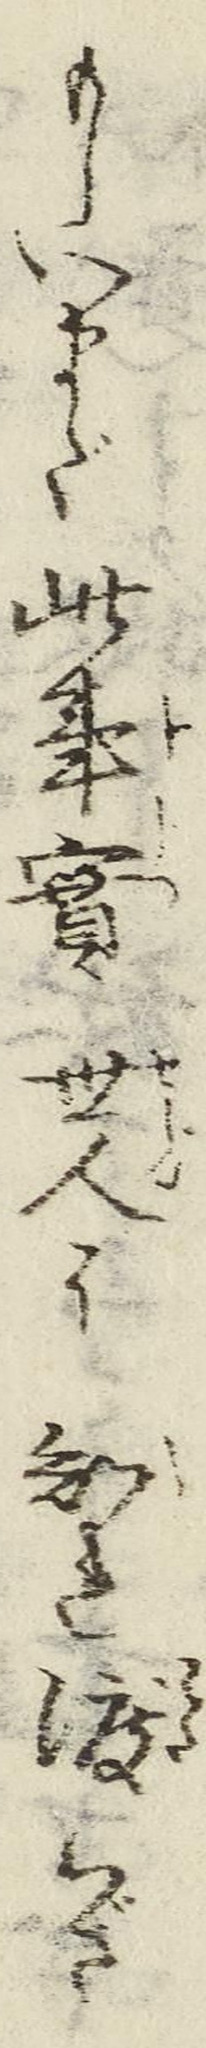もしいまだ此事実世人に知れ渡らざ
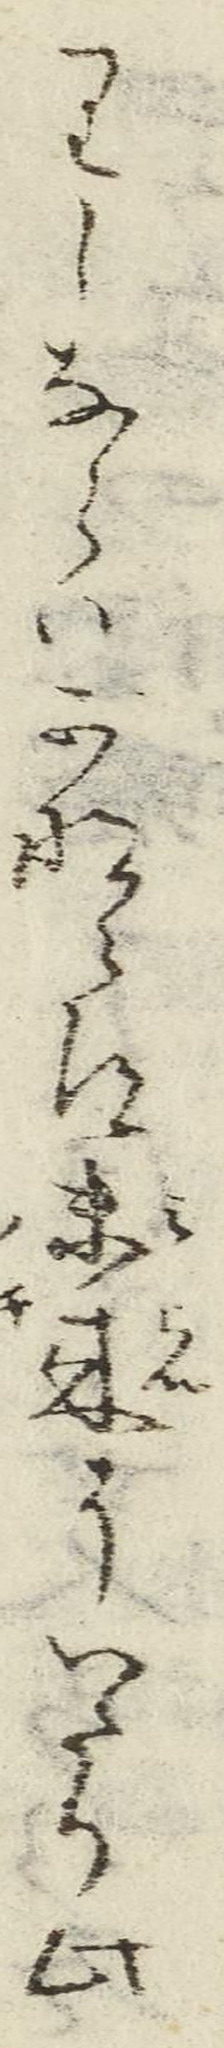りしならはかならす未来にいたり此
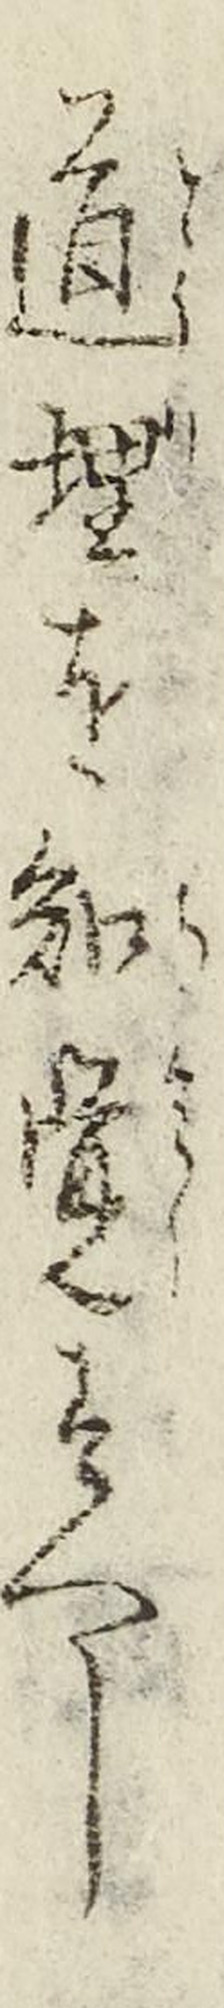道理を知覚すへし
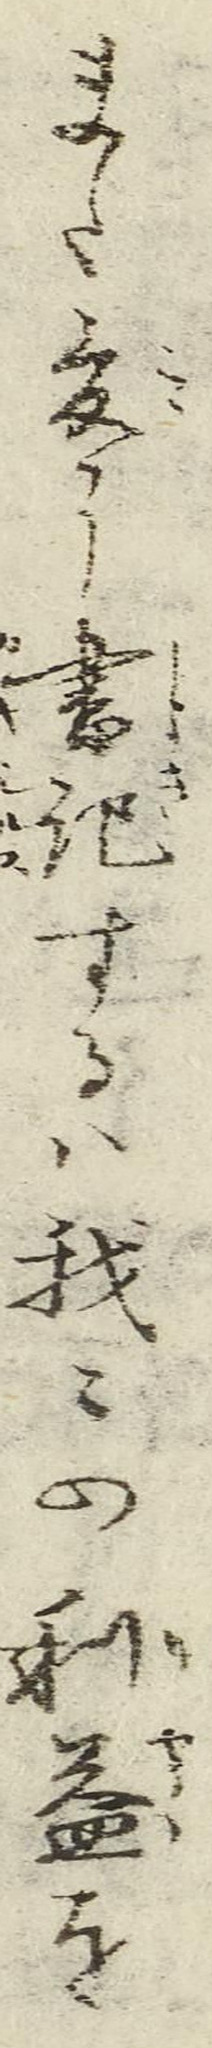また爰に書記するは我〻の利益を
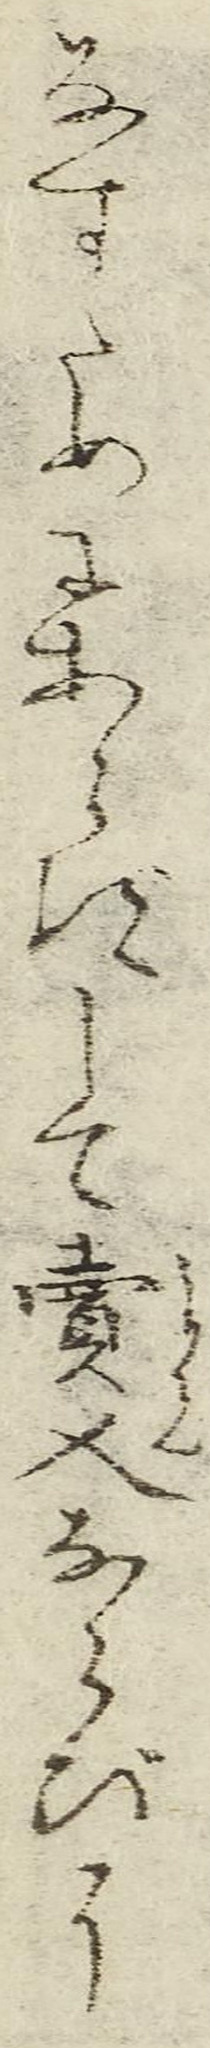なすためにあらずして売人ならびに

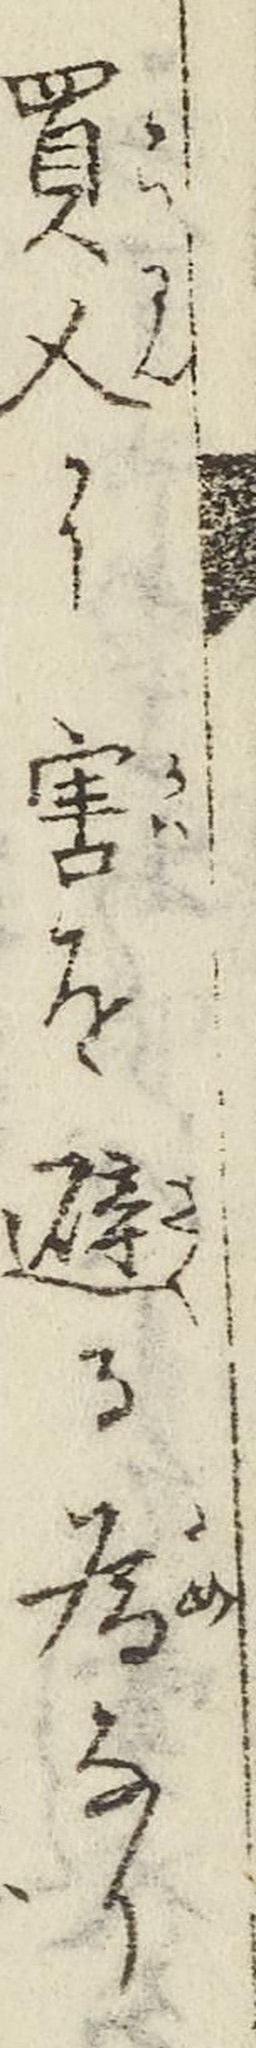買人に害を避る為なり
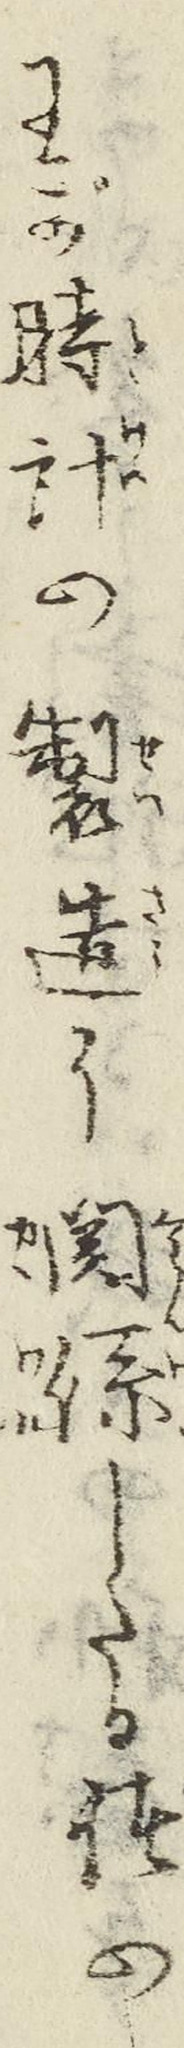わが時計の製造に関係したる諸の
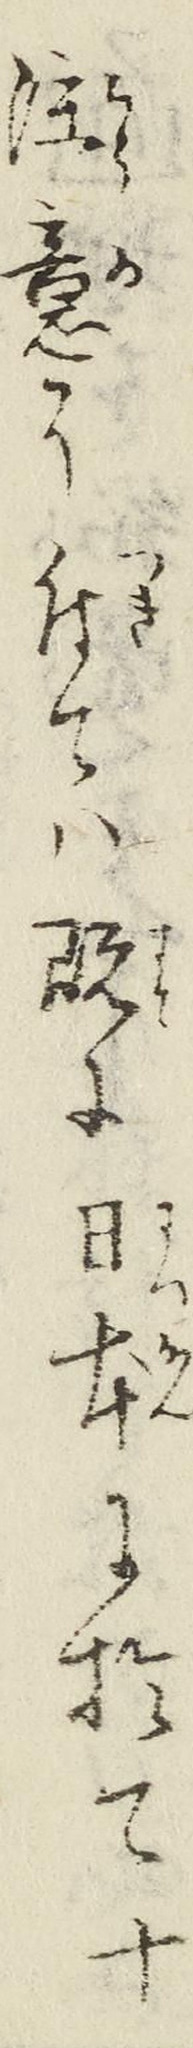注意に付ては既に日本に於て十
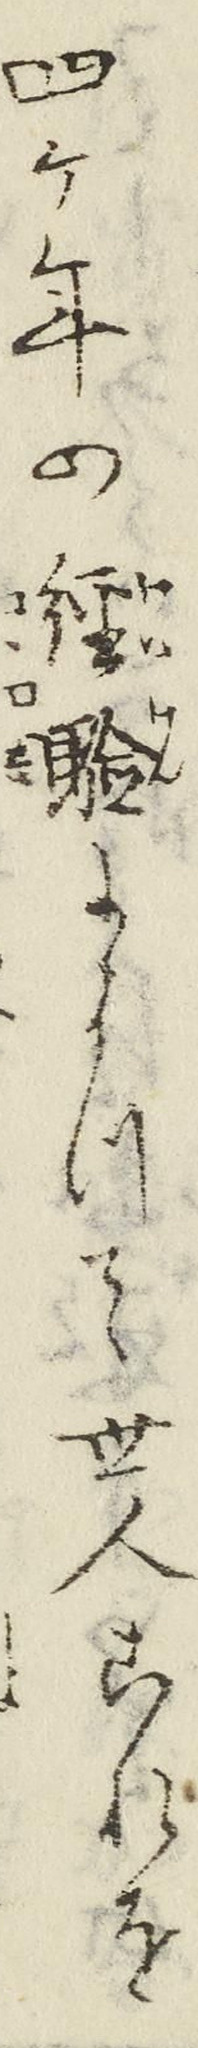四ヶ年の経験によつて世人これを
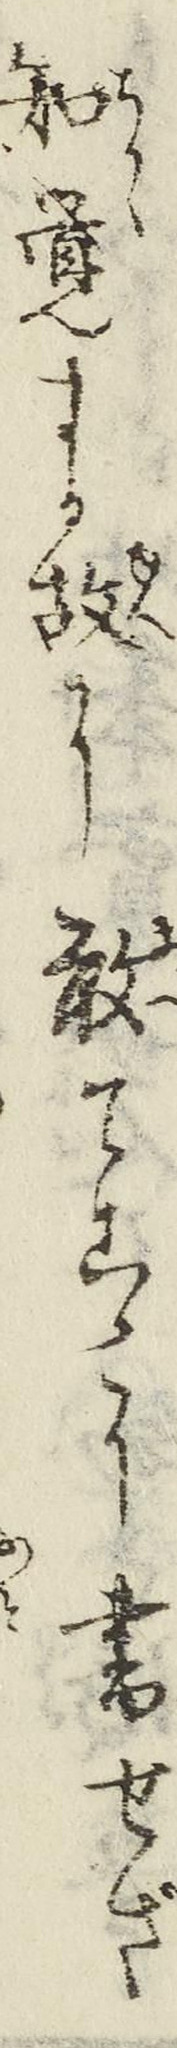知覚する故に敢てこゝに書せざ
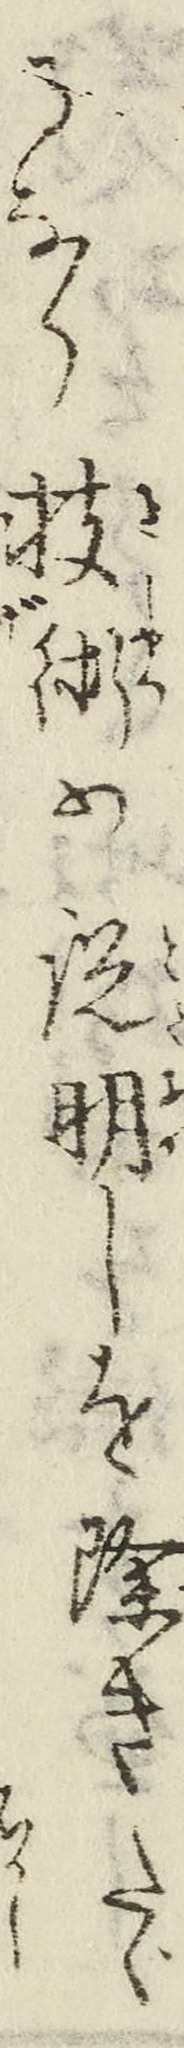るなり技術の説明しを除きたゞ
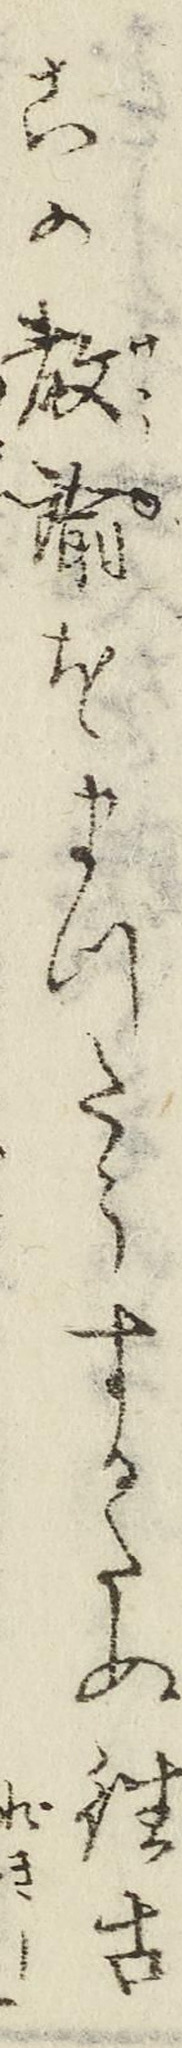この教諭をまつたうするため往古
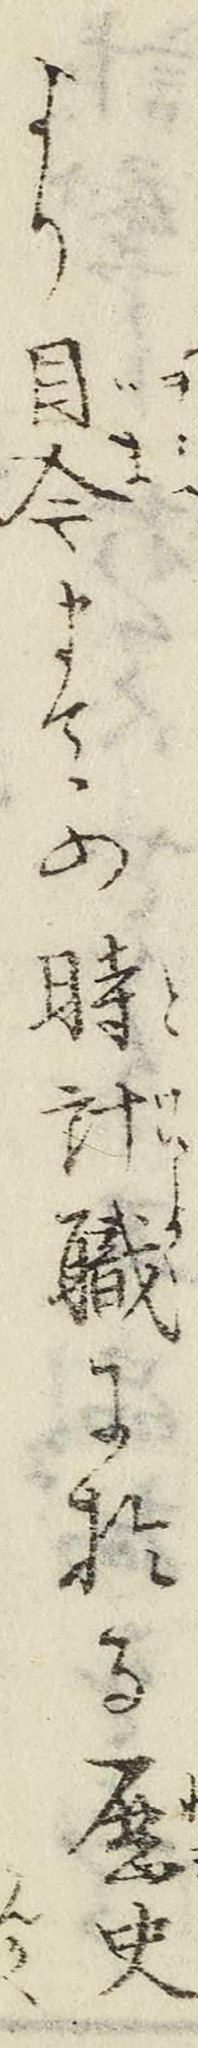より目今まての時計職に於る歴史
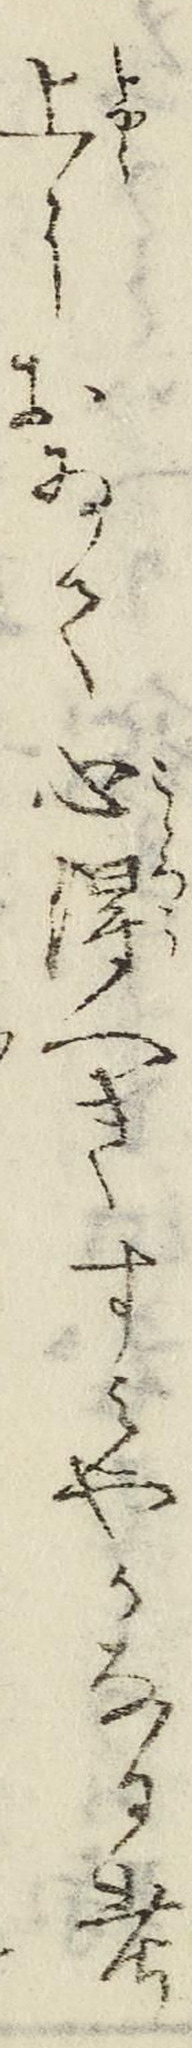上におゐて心得へきすみやかなる考
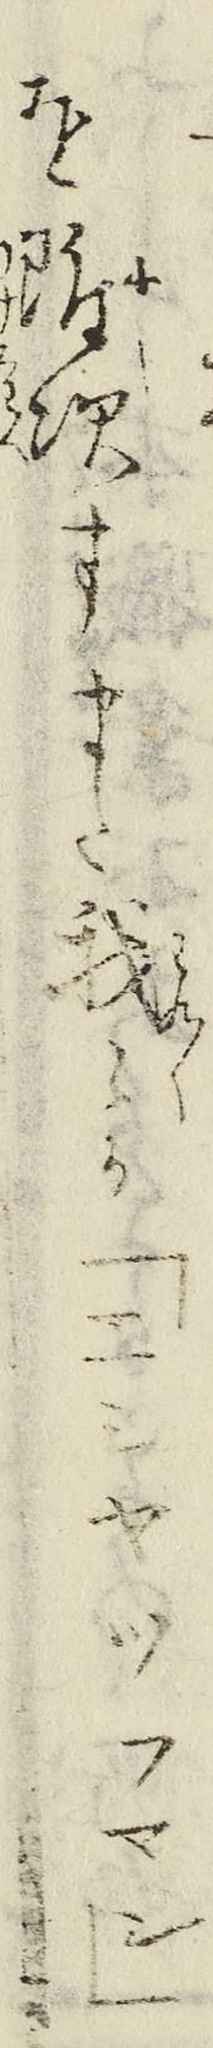を附次すまた我〻か「エシヤツフマン」
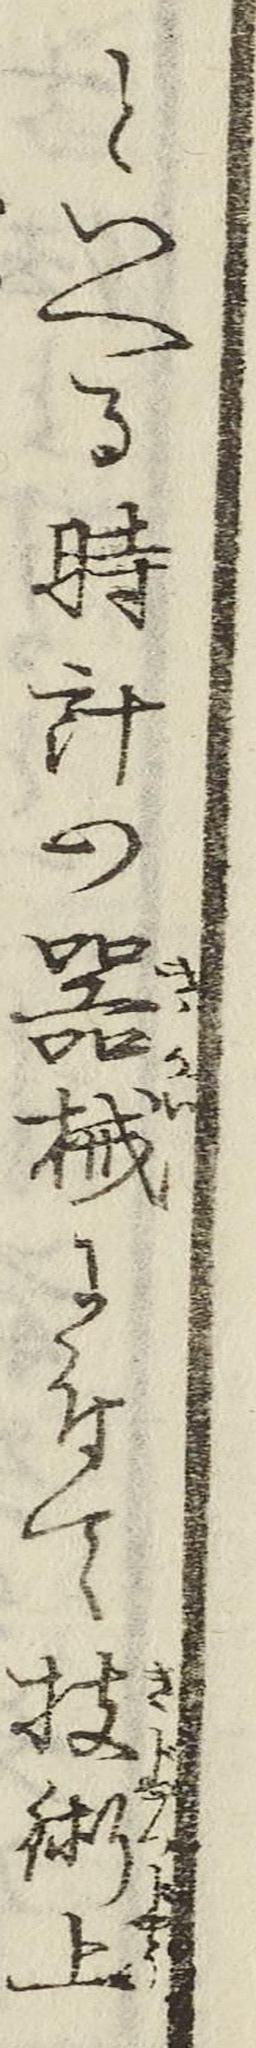といへる時計の器械に付て技術上
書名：[時計に関する冊子]
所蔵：東京大学地震研究所図書室 Earthquake Research Institute Library, The University of Tokyo, JAPAN
